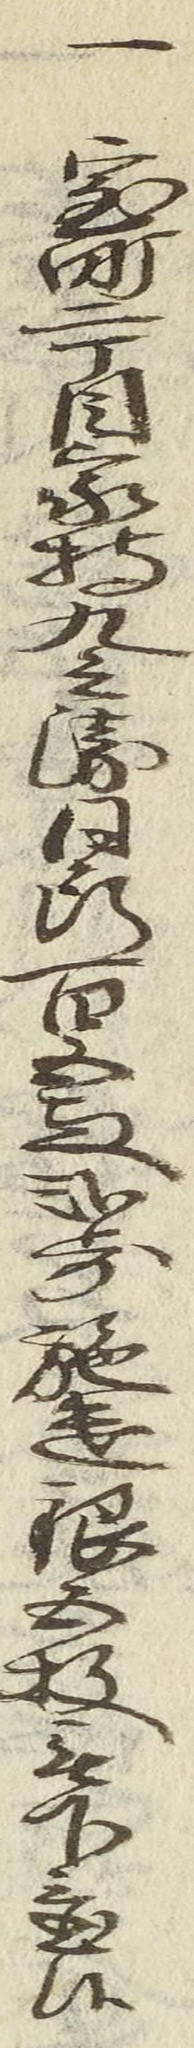一室町二丁目家持九兵衛同断百五両弐歩施遣銀五枚被下置候
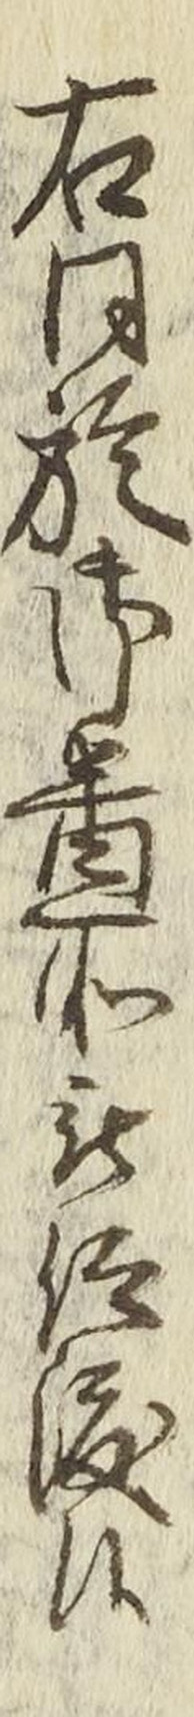右同於御番所被仰渡候
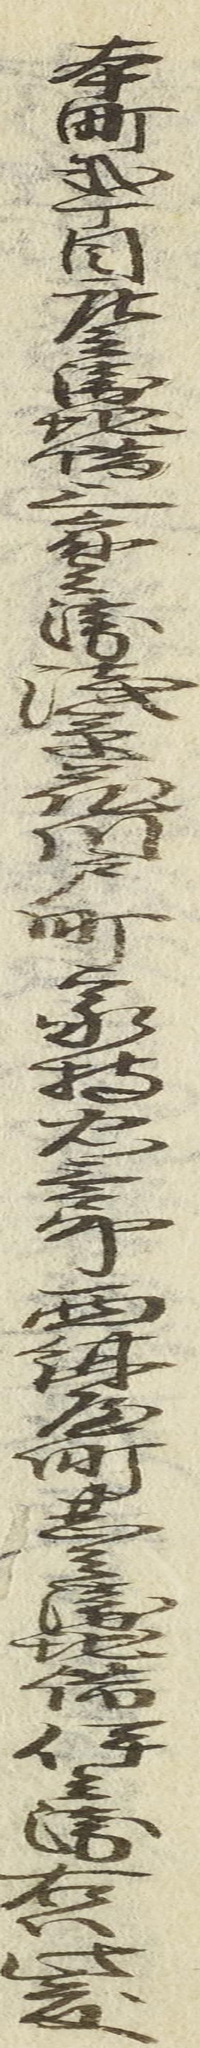一本町弐丁目庄兵衛地借三郎兵衛浅草花川戸町家持忠三郎西紺屋町甚兵衛地借伊兵衛右は此度
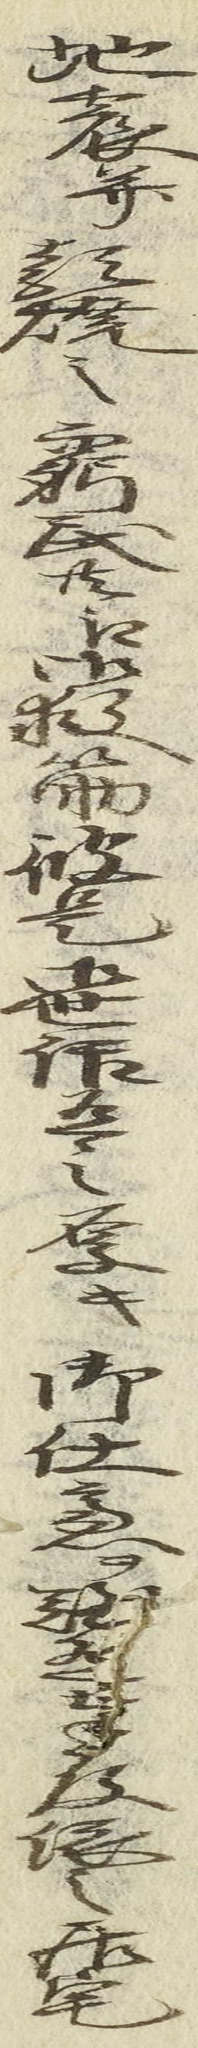地震幷類焼之窮民共江御救筋彼是御世話有之厚キ御仕慮ヲ難有奉存依之居宅
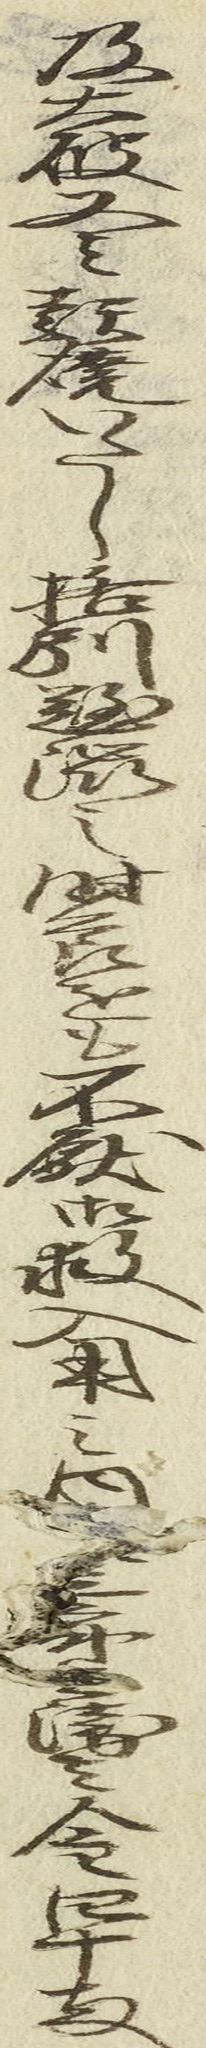及大破又者類焼いたし格別難渋之時節をも不厭御救入用之内江？三郎兵衛者金四十両
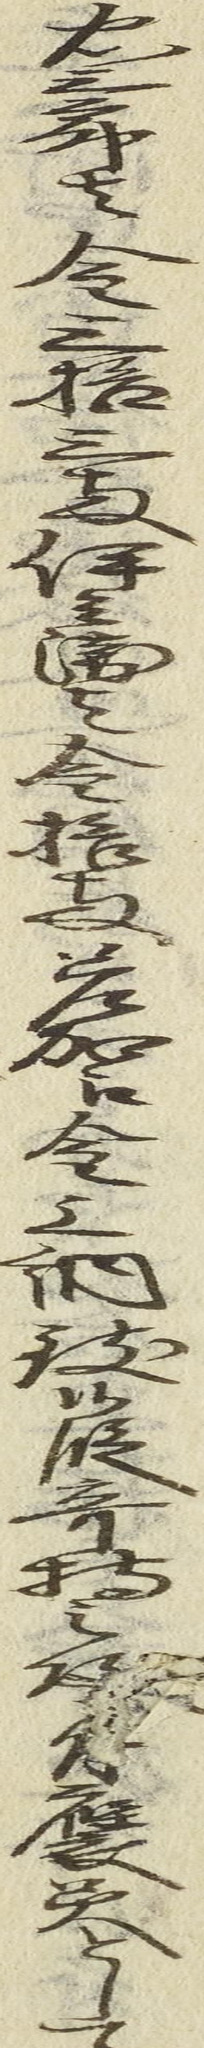忠三郎者金三拾三両伊兵衛者金拾両差加江金上納致候段奇特之儀ニ付褒美として
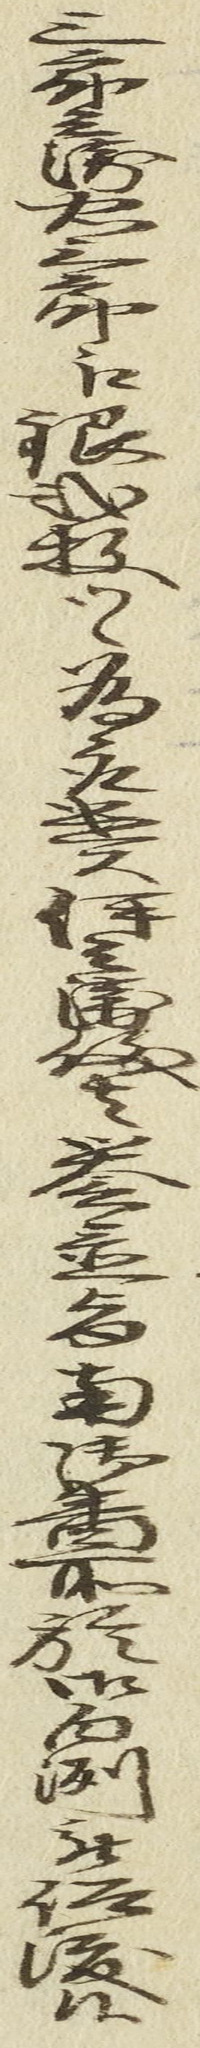三郎兵衛忠三郎江銀弐枚ツゝ為取遣ス伊兵衛儀者誉置旨南御番所於御白洲被仰渡候
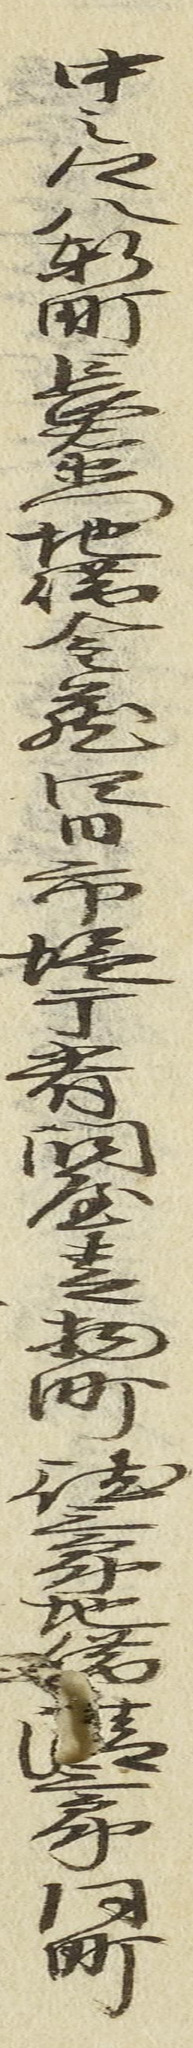一中之郷八軒町長右衛門地借金蔵四日市堤干肴問屋青物町徳三郎地借清三郎同町
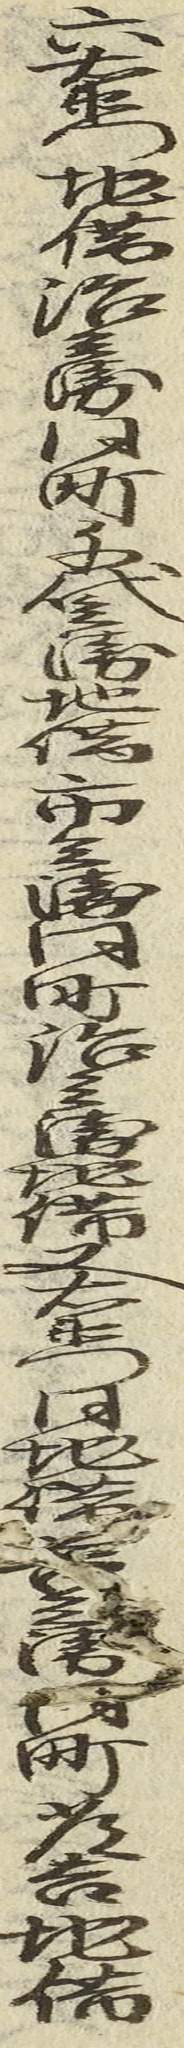六右衛門地借治兵衛同町千代兵衛地借市兵衛同町治兵衛地借又右衛門同地借善兵衛同町常吉地借
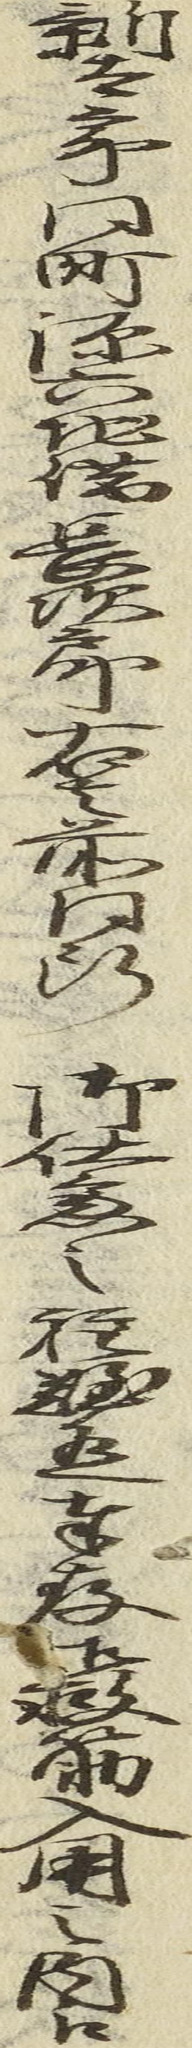新太郎同町源六地借長次郎右者前同断御仕慮之程難有奉存御救筋入用之内江
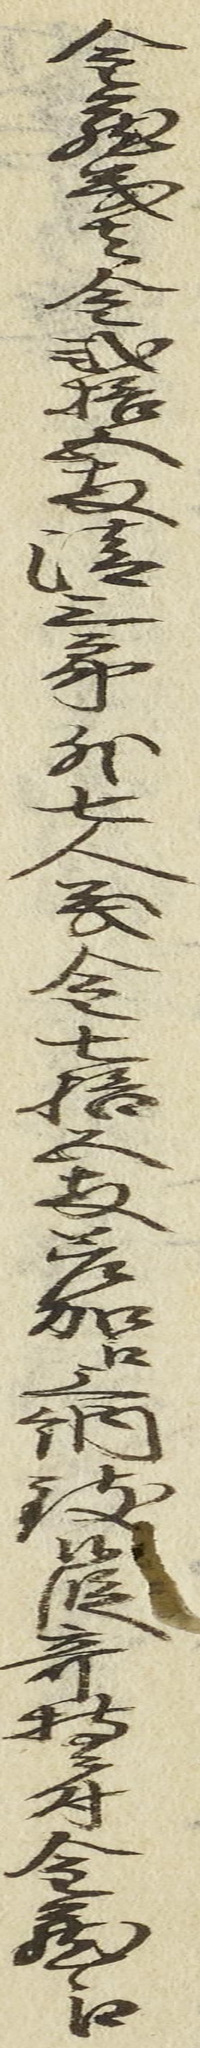金蔵義者金弐拾五両清三郎外七人義金七拾五両差加江上納致候段奇特ニ付金蔵江
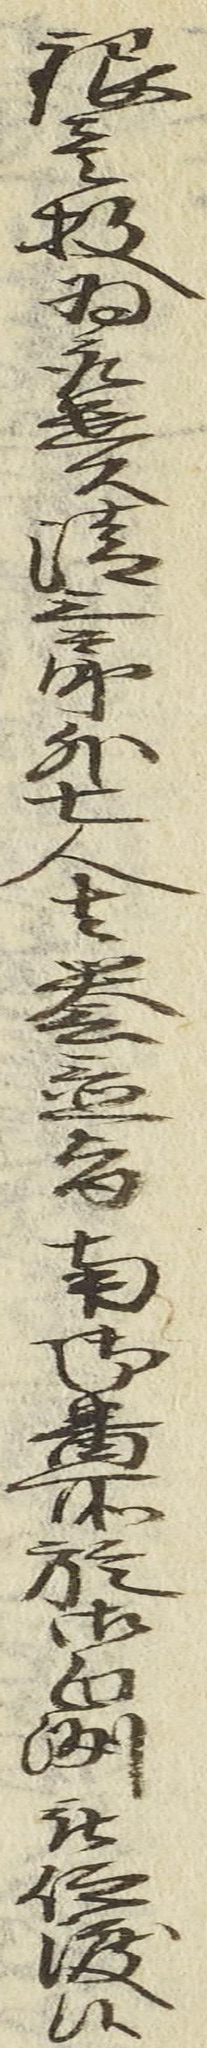銀壱枚為取遣ス清三郎外七人者誉置旨南御番所於御白洲被仰渡候
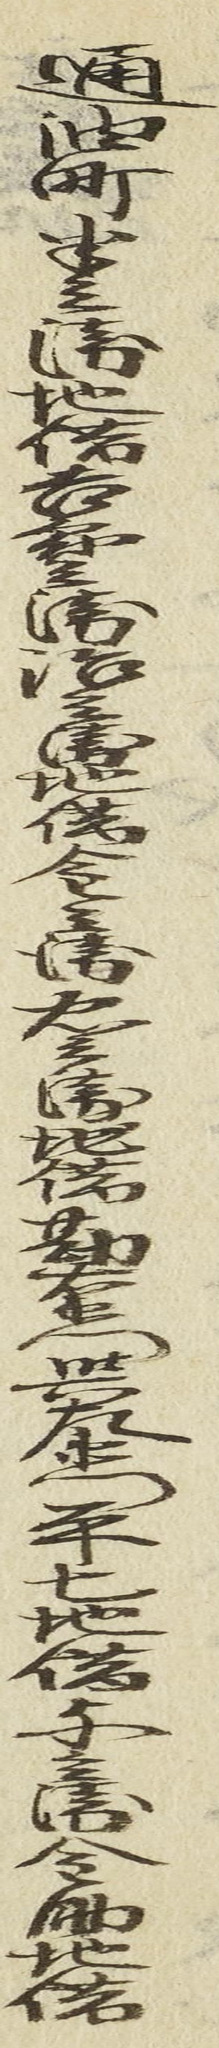一通油町半兵衛地借吉郎兵衛治兵衛地借金兵衛忠兵衛地借勘右衛門与左衛門平七地借与兵衛金助地借
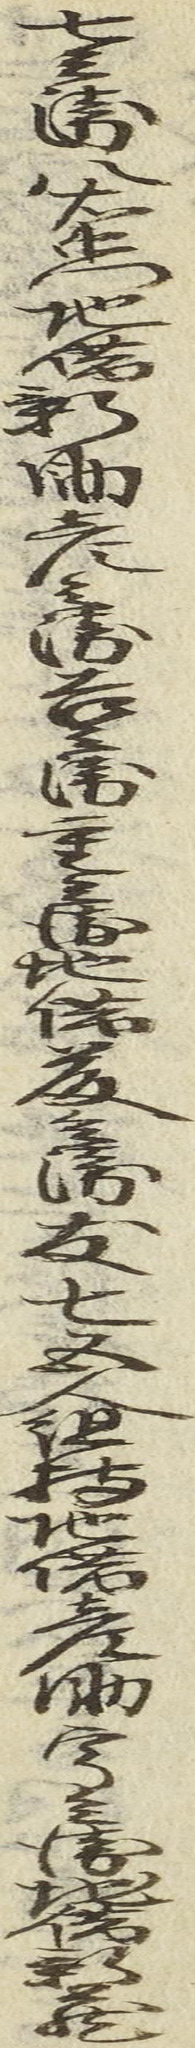七兵衛八右衛門地借新助彦兵衛吉兵衛重兵衛地借藤兵衛友七五人組持地借彦助宇兵衛地借新蔵
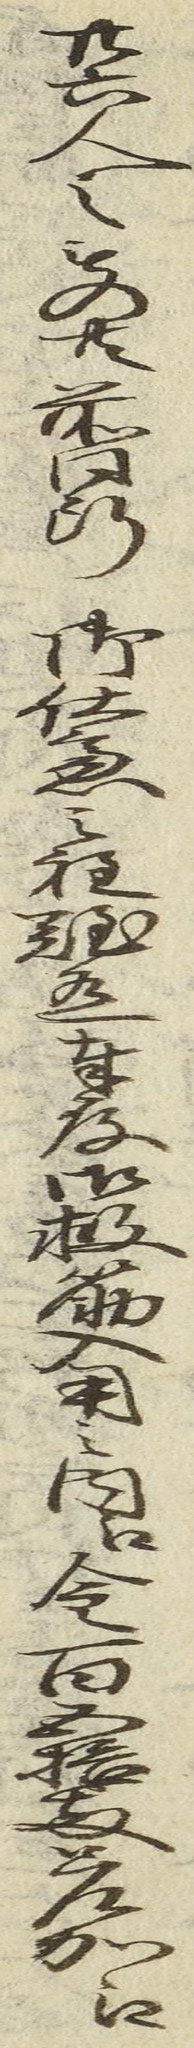廿六人之もの共前同断御仕慮之程難有奉存御救筋入用之内江金百五拾両差加江
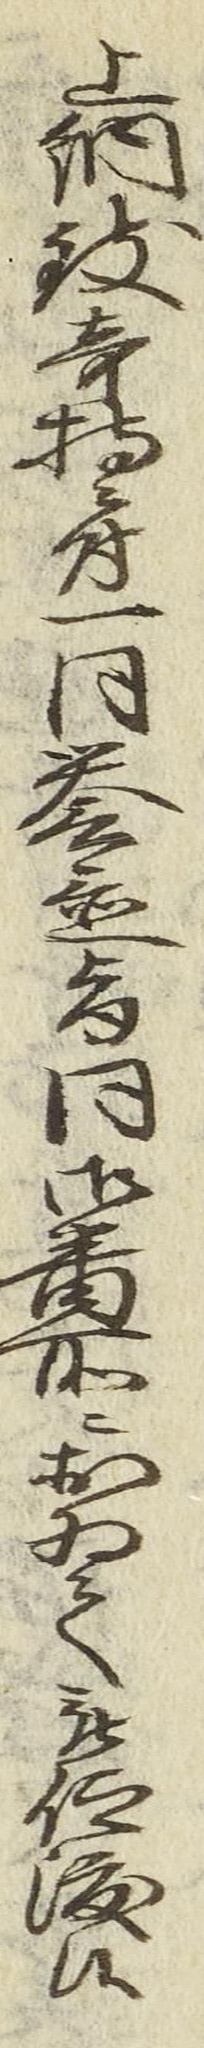上納致奇特ニ付一同誉置旨同御番所ニおゐて被仰渡候
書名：安政二年震災記事　完
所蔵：東京大学地震研究所図書室 Earthquake Research Institute Library, The University of Tokyo, JAPAN
